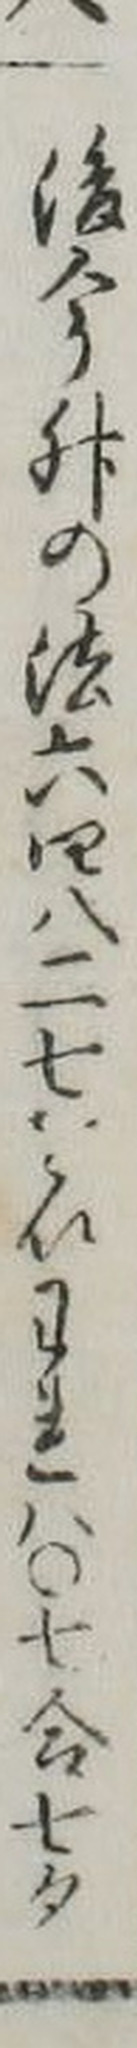後今升の法六四八二七を以われは〇七合七勺
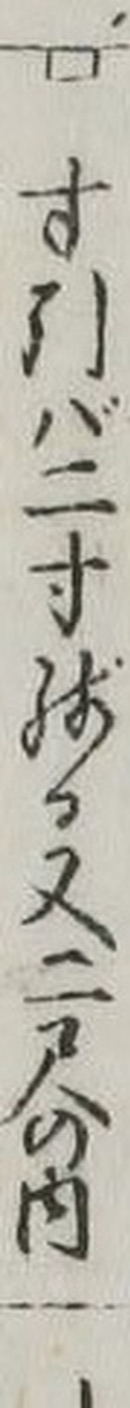長さ寸引ば二寸残る又二尺の内
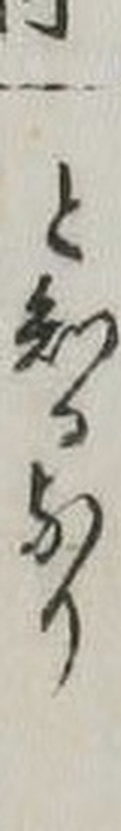と知るなり
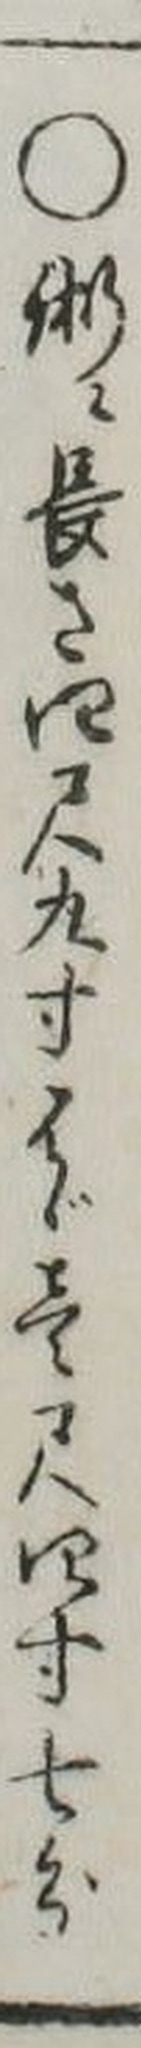○術に長さ四尺九寸はゞ壱尺四寸七分
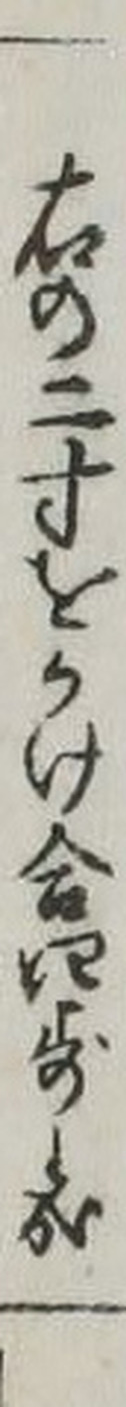下右の二寸をかけ合四歩と成
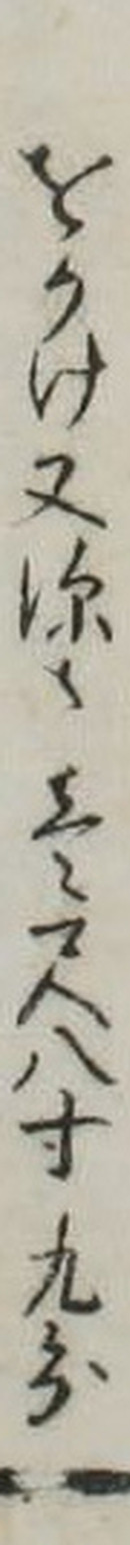さ九分をかけ又深さ壱尺八寸九分
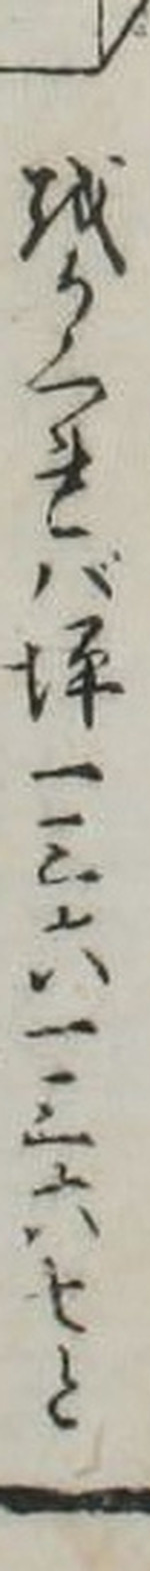四をかくれば坪一三六一三六七と
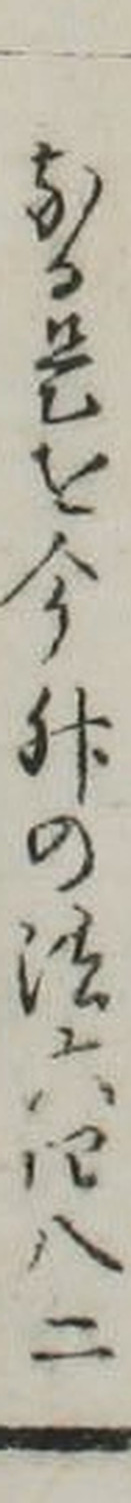尺なる是を今升の法六四八二
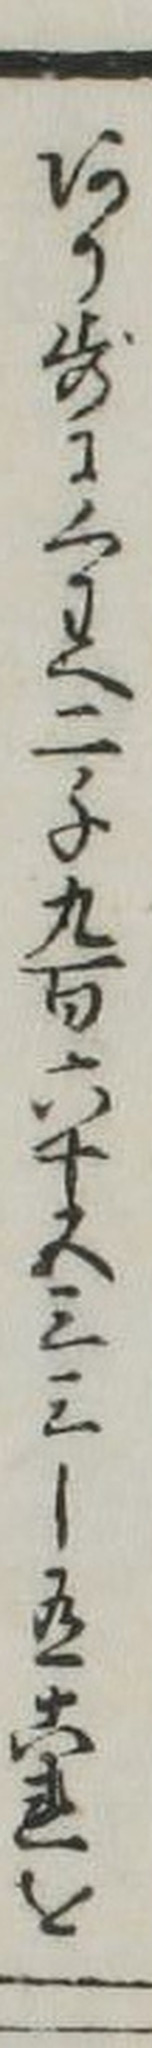あり歩にくわへ二千九百六十五三三ー有これを
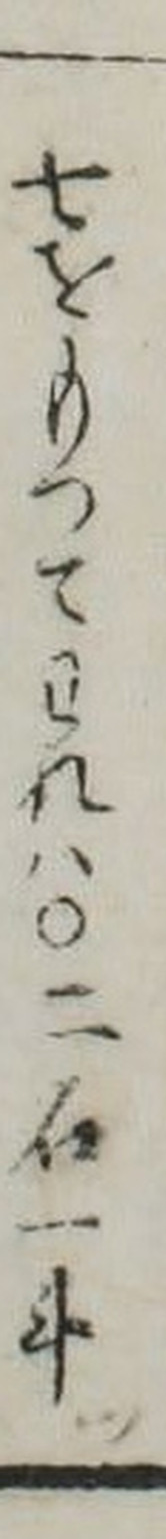九七をもつてわれは〇二石一斗
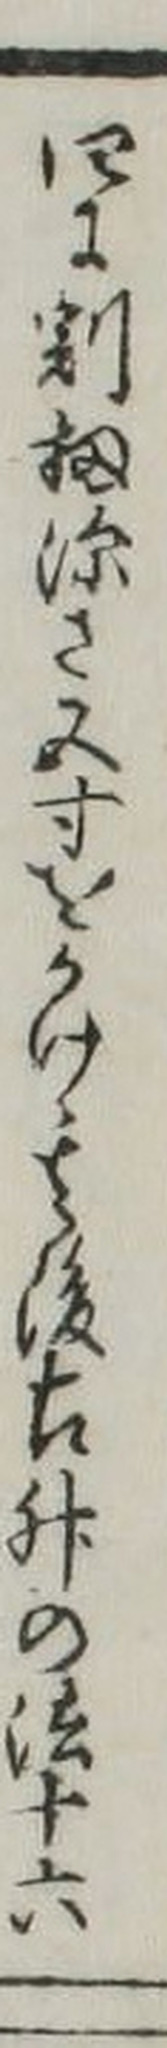四に割扨深さ五寸をかけ其後古升の法十六
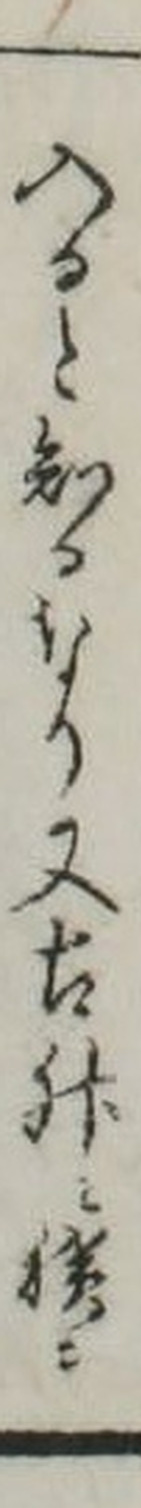寸入ると知るなり又古升に積
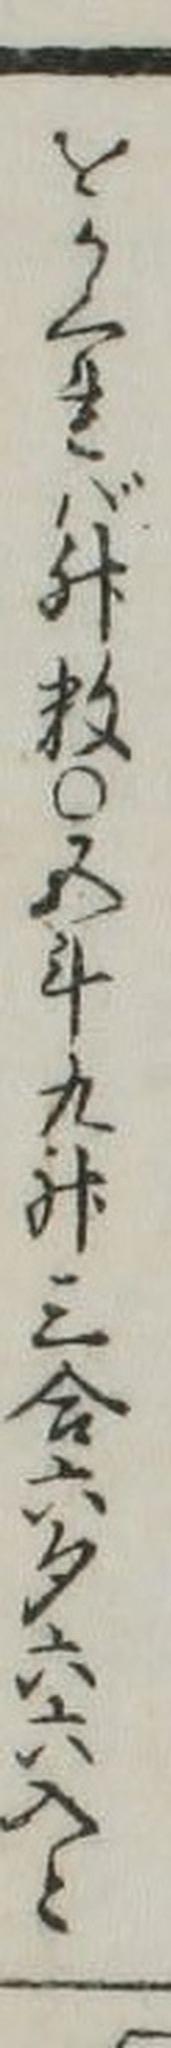をかくれば升数〇五斗九升三合六勺六六入と
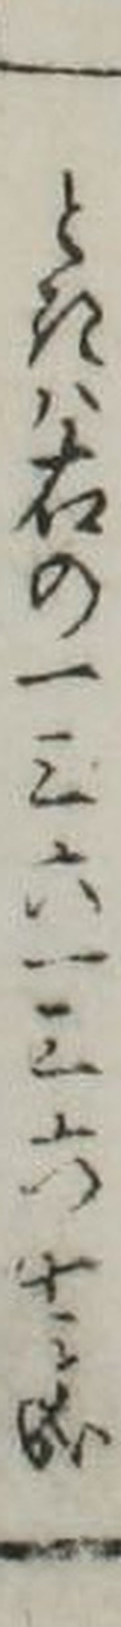ときは右の一三六一三六七に成
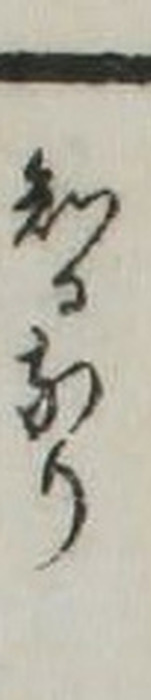知るなり
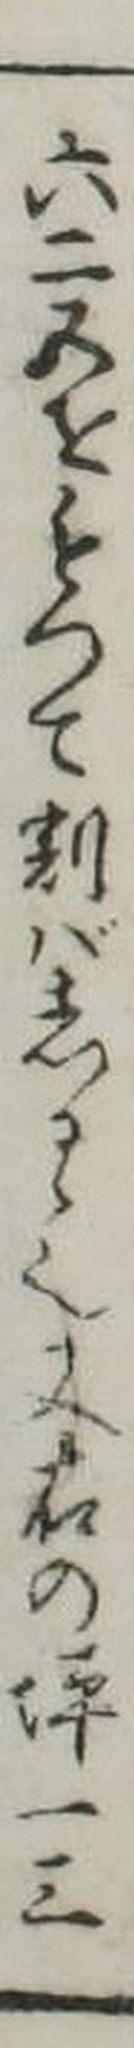六二五をもつて割ば知るゝ也又右の坪一三
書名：宝玉塵劫記
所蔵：東京学芸大学教育コンテンツアーカイブ
